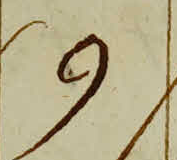9
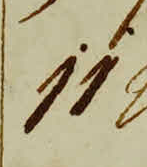11
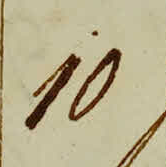10
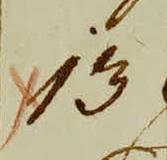13
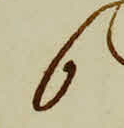6
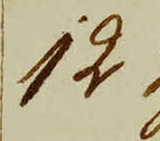12
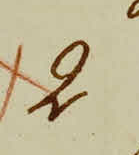2
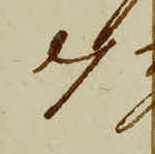7
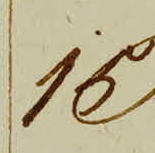15
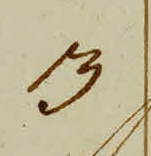3
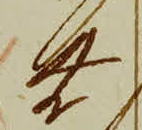4
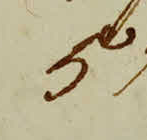5
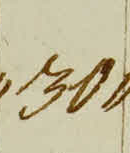30
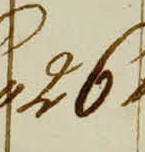26
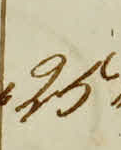25
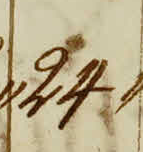24
